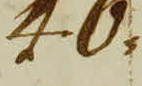40
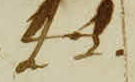41
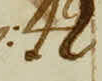42
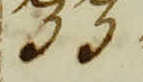33
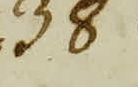38
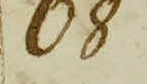68
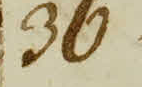36
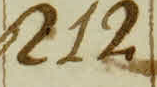212
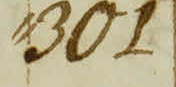301
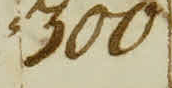300
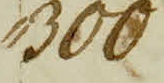300
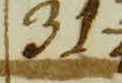31
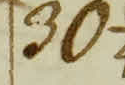30
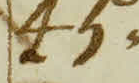45
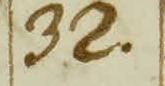32.
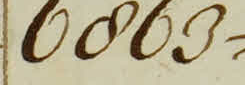6863
